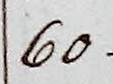60
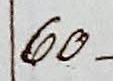60
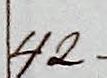42
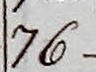76
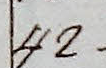42
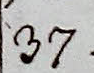37
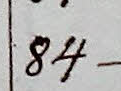84
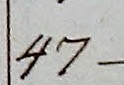47
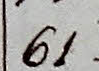61
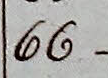66
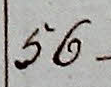56
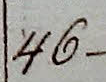46
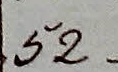52
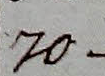70
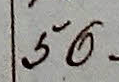56
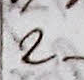2
